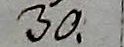30.
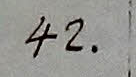42.
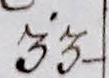33
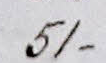51
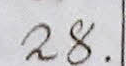28
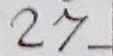27
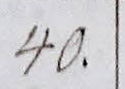40.
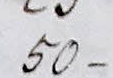50
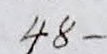48
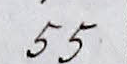55
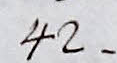42
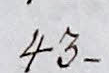43
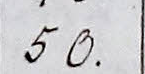50.
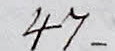47
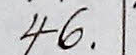46.
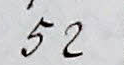52
